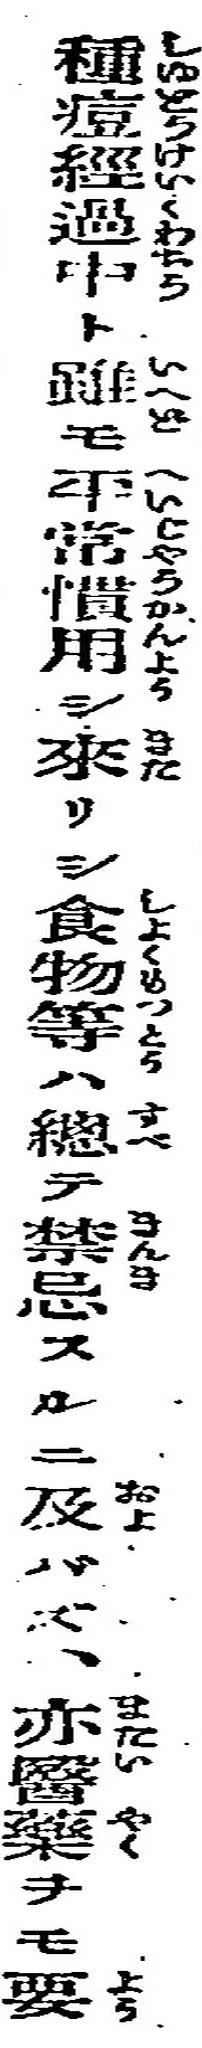種痘経過中ト雖モ平常慣用シ来リシ食物等ハ総テ禁忌スルニ及バズ、亦医薬ヲモ要
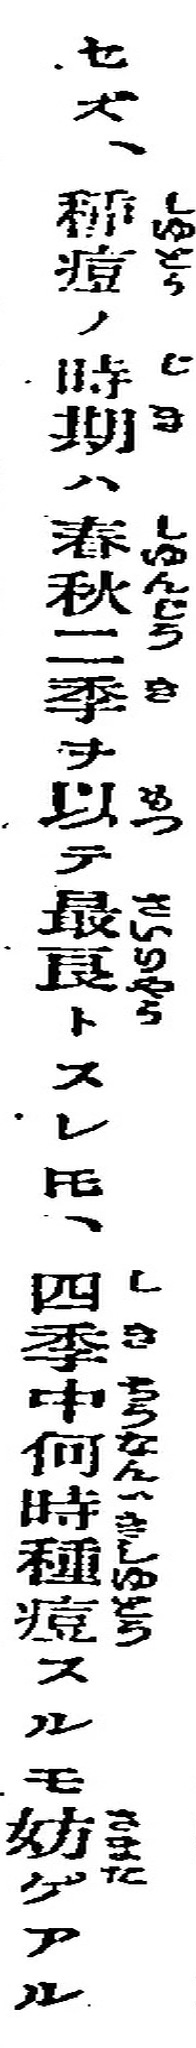セズ、種痘ノ時期ハ春秋二季ヲ以テ最良トスレ𪜈、四季中何時種痘スルモ妨ゲアル
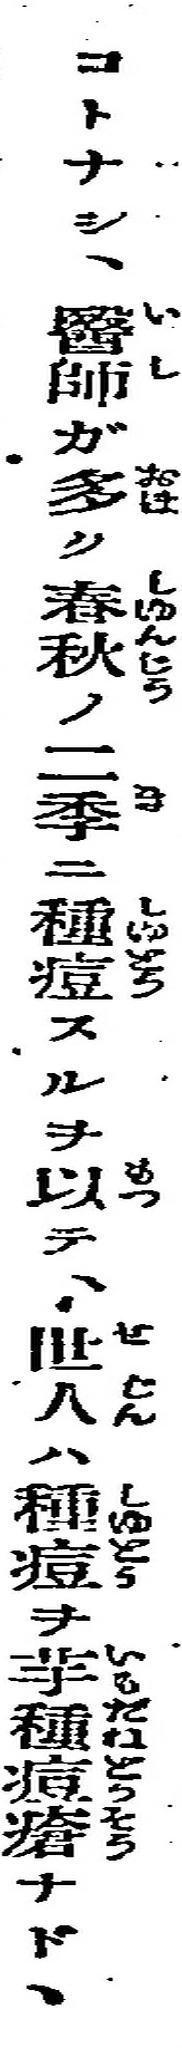コトナシ、医師ガ多ク春秋ノ二季ニ種痘スルヲ以テ、世人ハ種痘ヲ芋種痘瘡ナドヽ
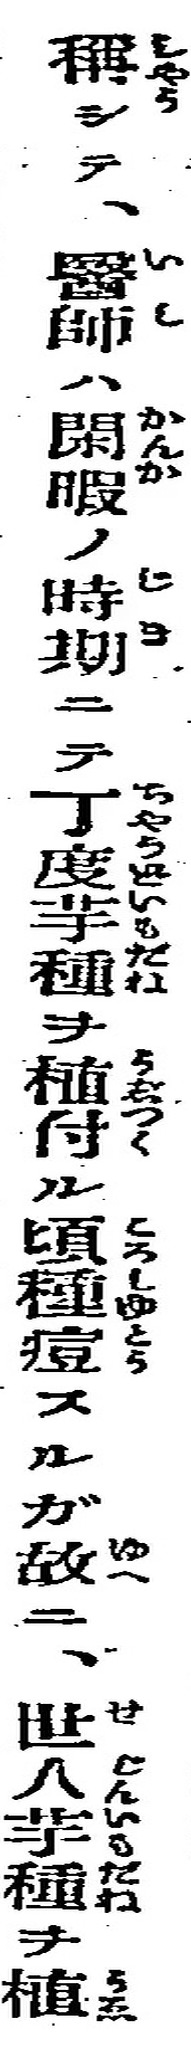称シテ、医師ハ閑暇ノ時期ニテ丁度芋種ヲ植付ル頃種痘スルガ故ニ、世人芋種ヲ植
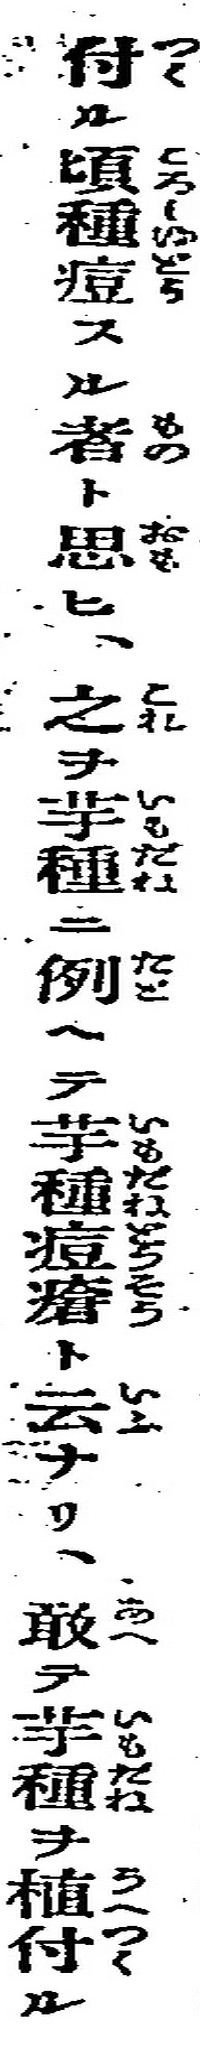付ル頃種痘スル者ト思ヒ、之ヲ芋種ニ例ヘテ芋種痘瘡ト云ナリ、敢テ芋種ヲ植付ル
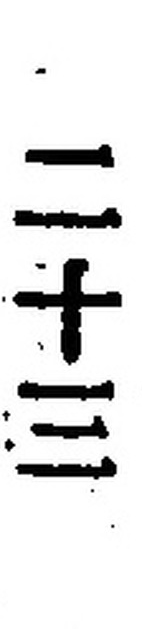二十三

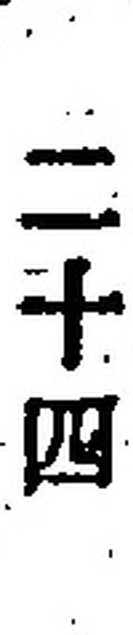二十四
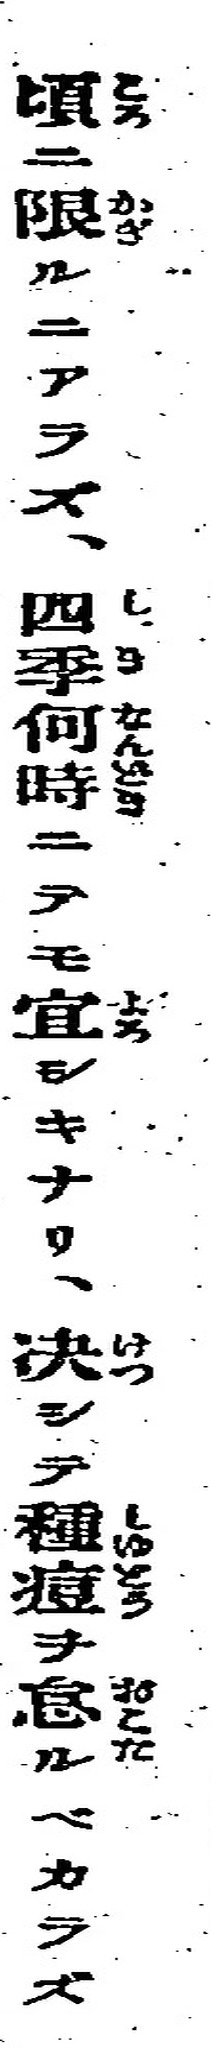頃ニ限ルニアラズ、四季何時ニテモ宜シキナリ、決シテ種痘ヲ怠ルベカラズ

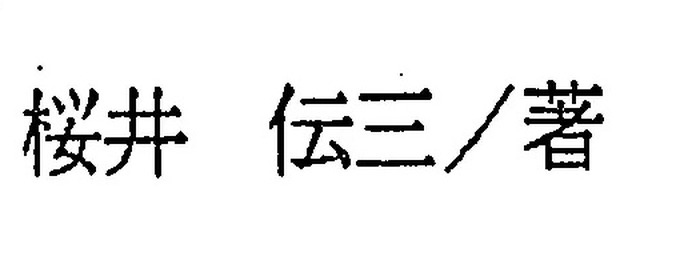桜井伝三著
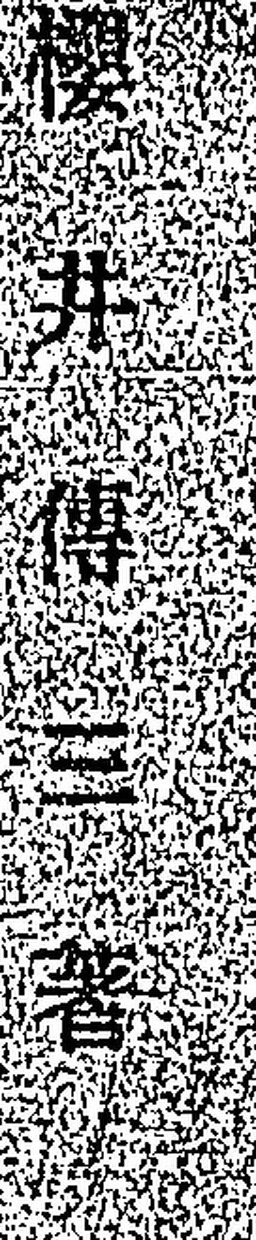桜井伝三著
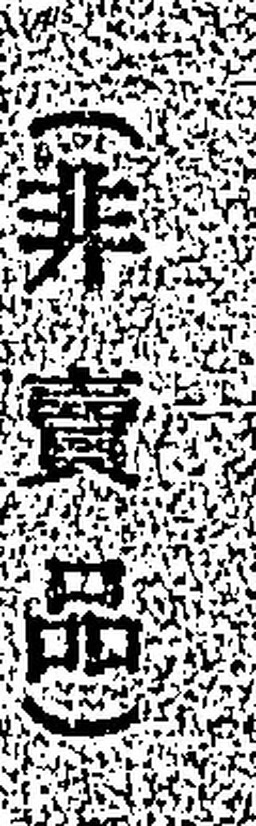(非売品)
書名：天然痘予防注意兼種痘者之注意
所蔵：国立国会図書館 National Diet Library, JAPAN
